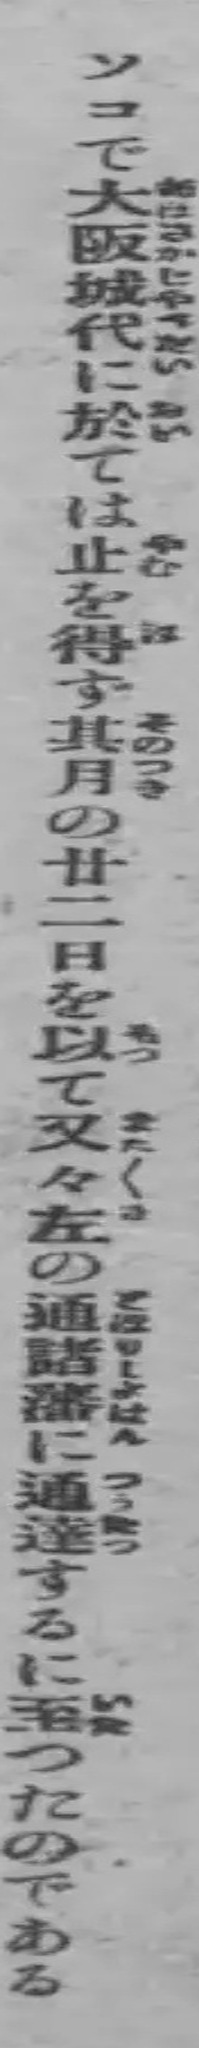ソコで大阪城代に於ては止を得ず其月の廿二日を以て又々左の通緒藩に通達するに至つたのである
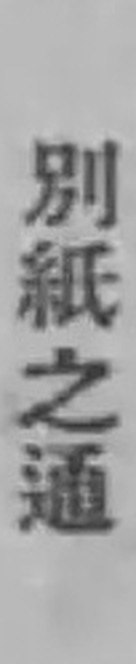別紙之通
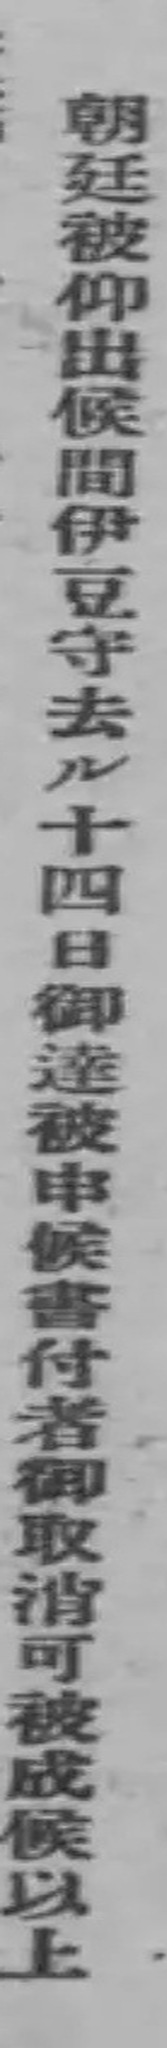朝廷被仰出候間伊豆守去ル十四日御達被申候書付者御取消可被成候以上
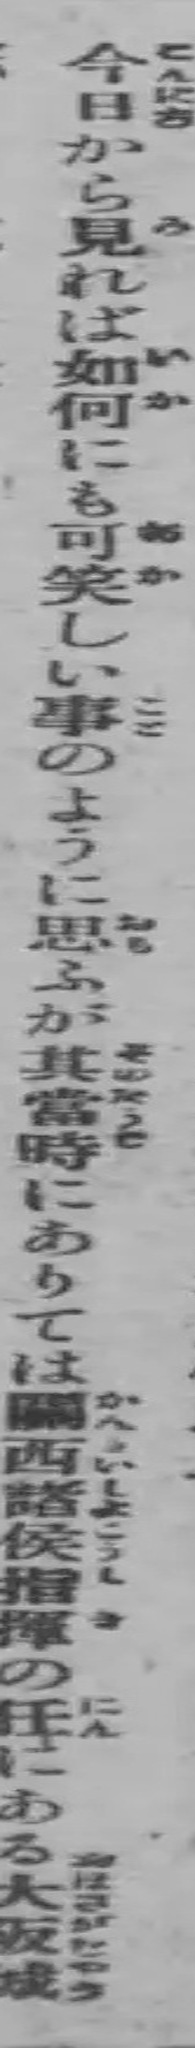今日から見れば如何にも可笑しい事のように思ふが其当時にありては関西諸侯指揮の任にある大阪城
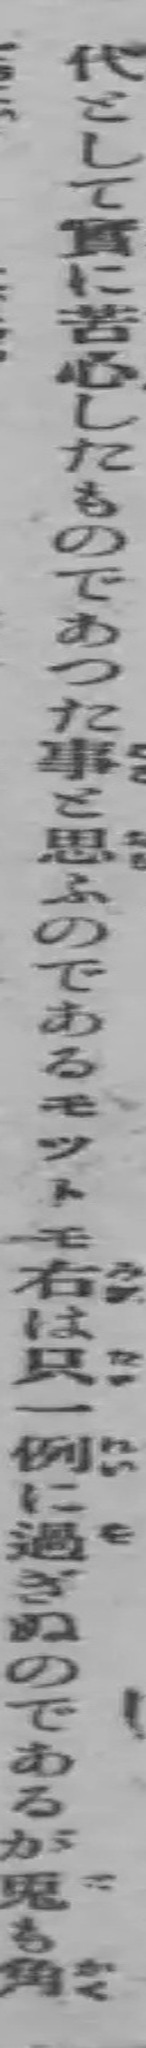代として実に苦心したものであつた事と思ふのであるモツトモ右は只一例に過ぎぬのであるが兎も角
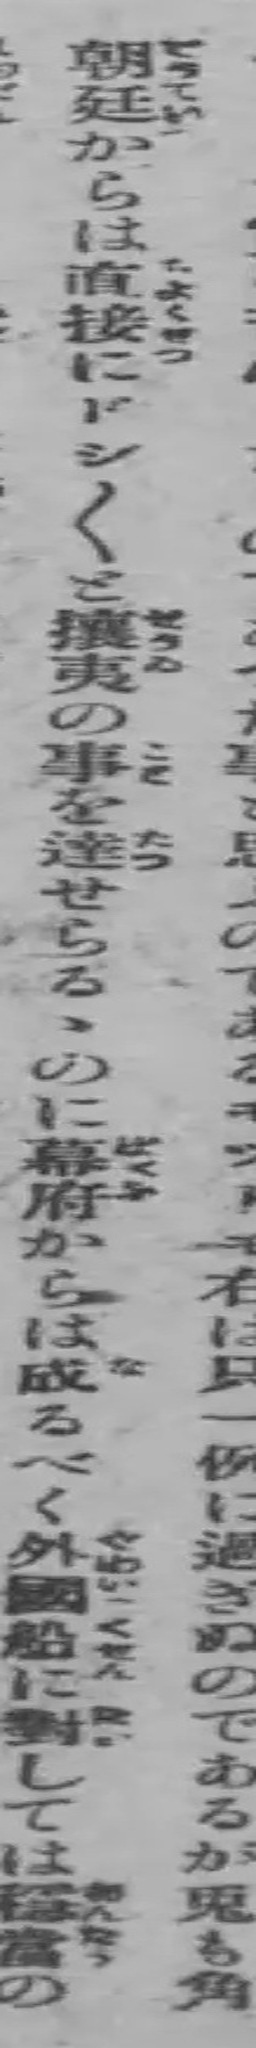朝廷からは直接にドシ〳〵と攘夷の事を達せらるゝのに幕府からは成るべく外国船に対しては穏当の
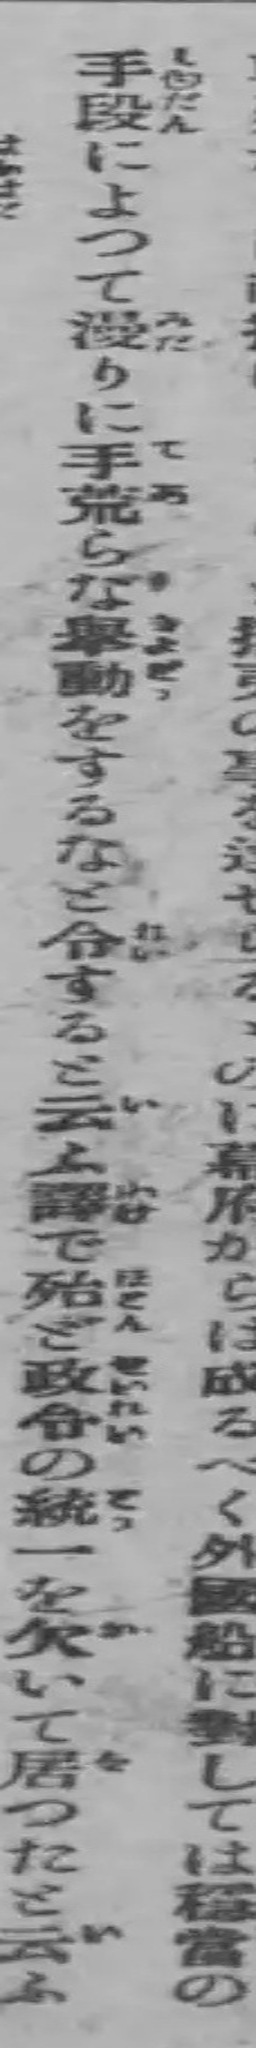手段によつて漫りに手荒らな挙動をするなと令すると云ふ訳で殆ど政令の統一を欠いて居つたと云ふ
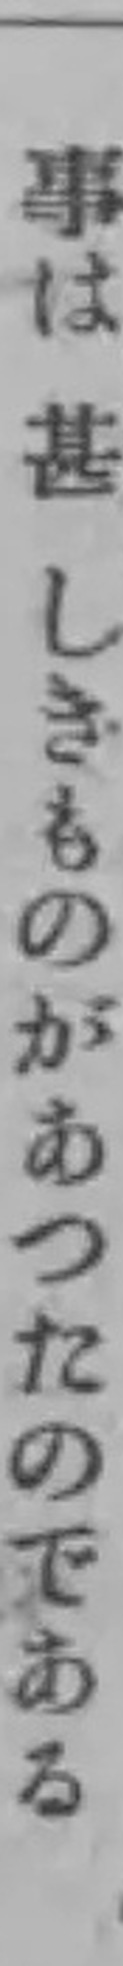事は甚しきものがあつたのである
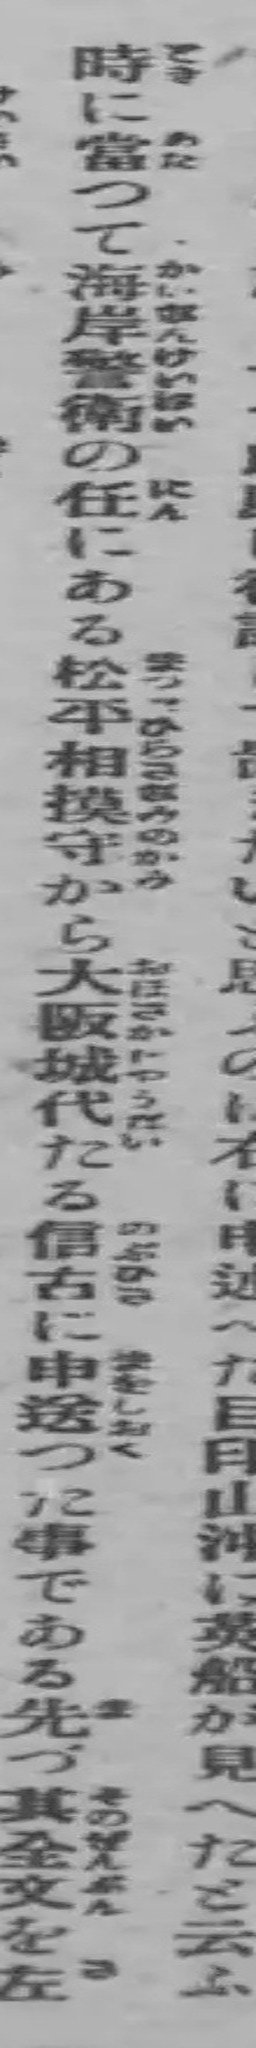時に当つて海岸警衛の任にある松平相摸守から大阪城代たる信古に申送つた事である先づ其全文を左
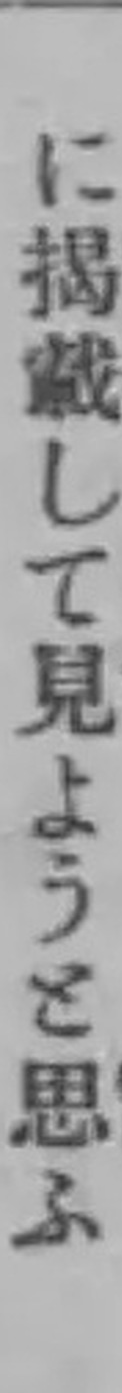に掲載して見ようと思ふ
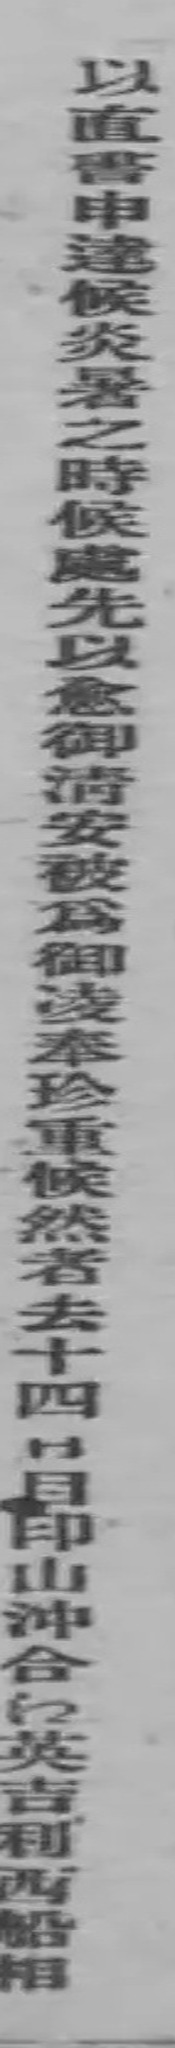以直書申達候炎暑之時候慮先以愈御清安被為御凌奉珍重候然者去十四日目印山沖合え英吉利西船相
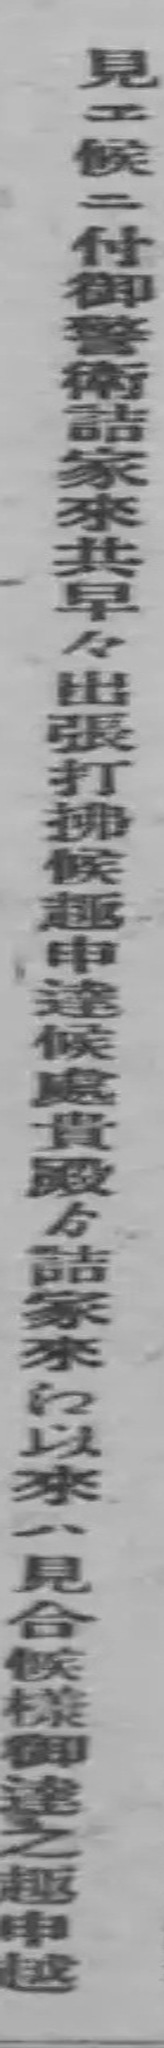見エ候ニ付御警衛詰家来共早々出張打払候趣申達候処貴殿ゟ詰家来え以来ハ見合候様御達之趣申越
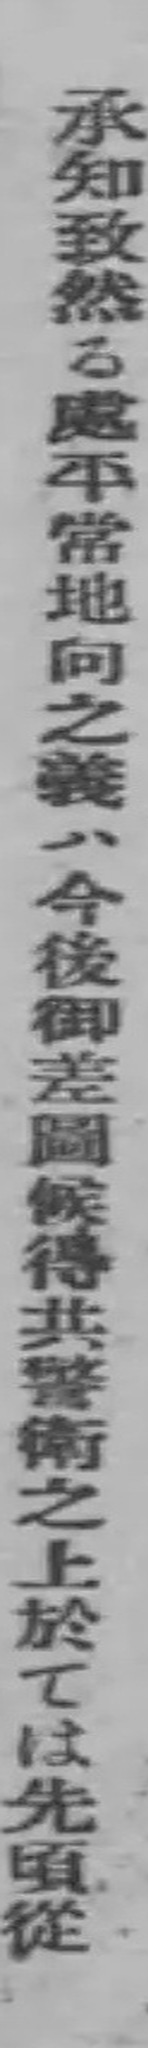承知致然る処平常地向之義ハ今後御差図候得共警衛之上於ては先頃従
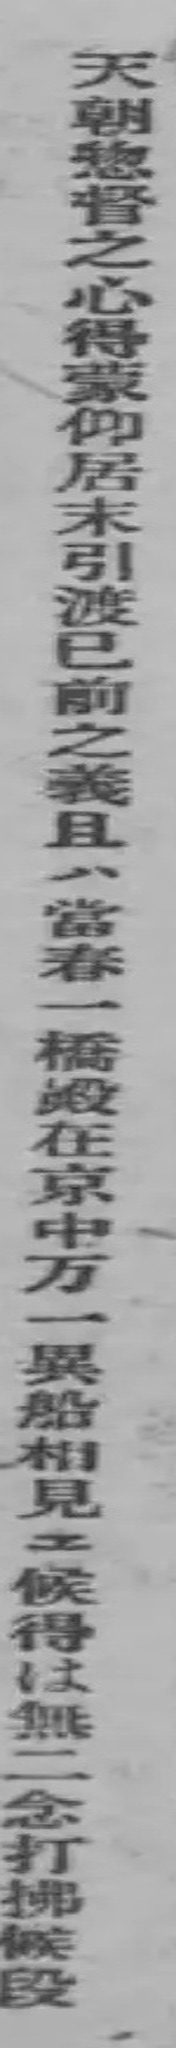天朝惣督之心得蒙仰居末引渡巳前之義且ハ当春一橋殿在京中万一異船相見エ候得は無二念打払候段
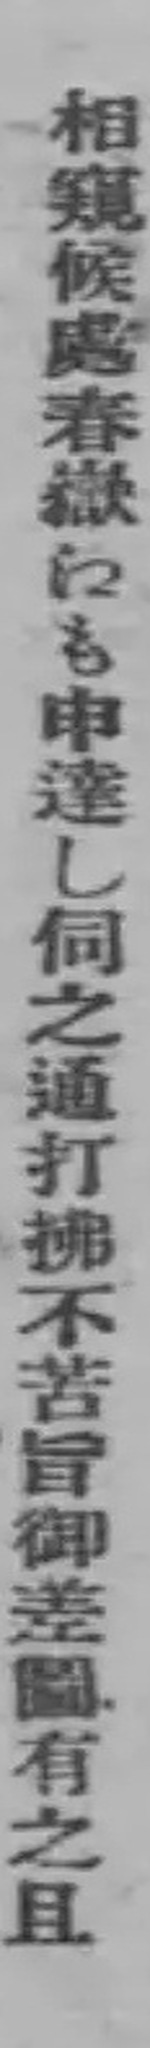相窺候処春嶽えも申達し伺之通打払不苦旨御差図有之且
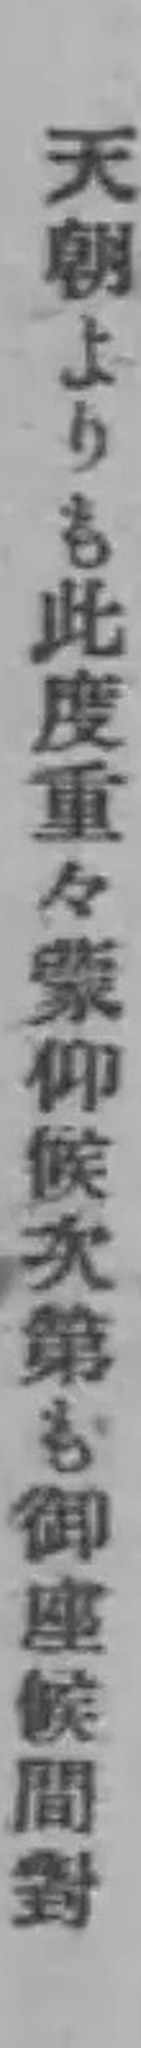天朝よりも此度重々蒙仰候次第も御座候間対
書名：豊橋市史談
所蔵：国立国会図書館 National Diet Library, JAPAN
